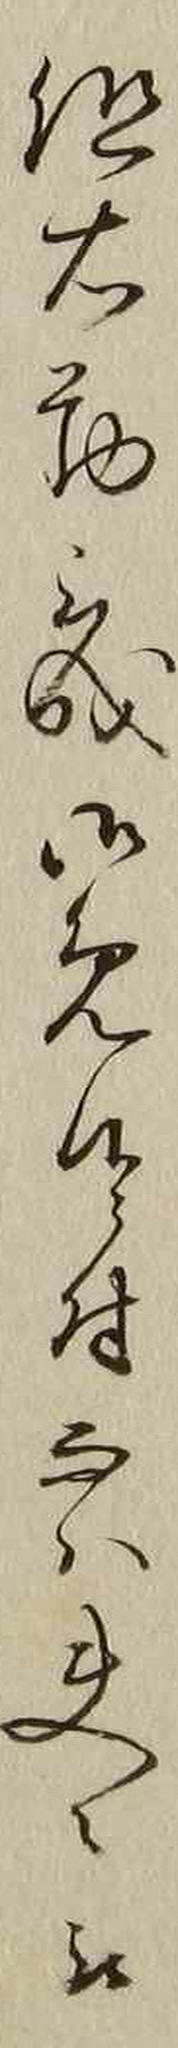但右勤被成御免候ニ付而ハ夫々被
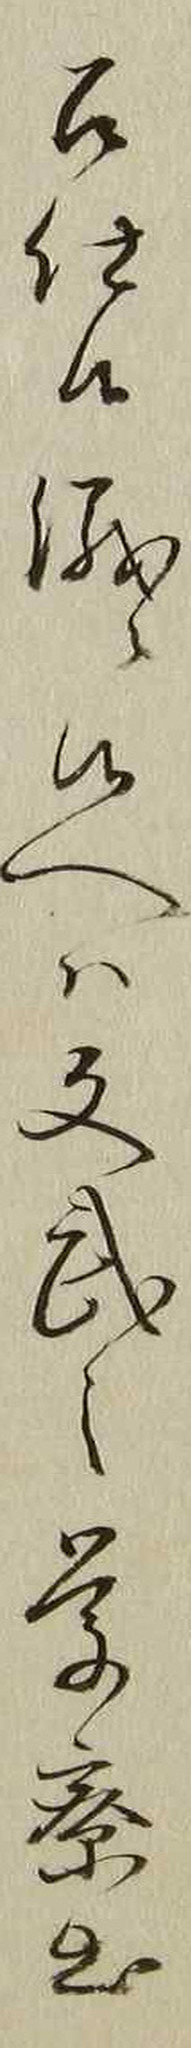召仕候儀ニ候ヘハ文武之学寮出
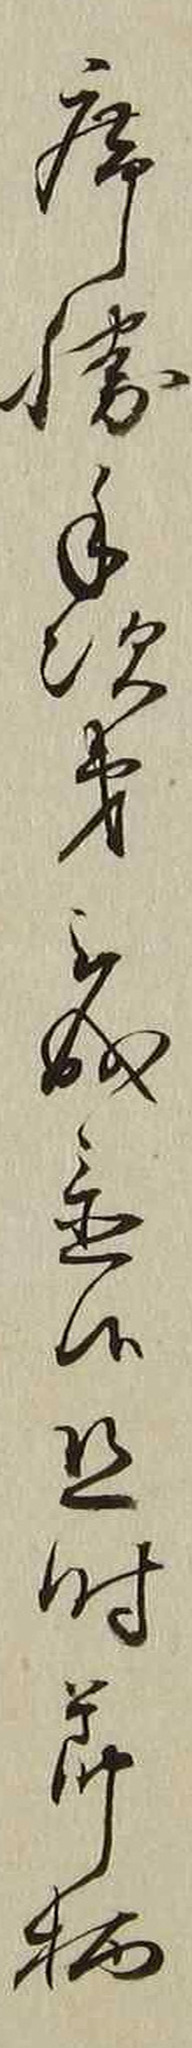席勝手次第被成置候且時節柄
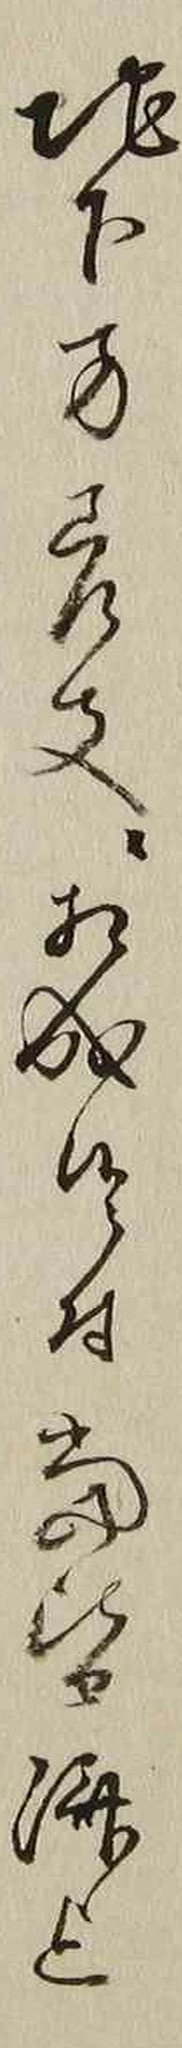地下方差支ニ相成候ニ付当皆済迄
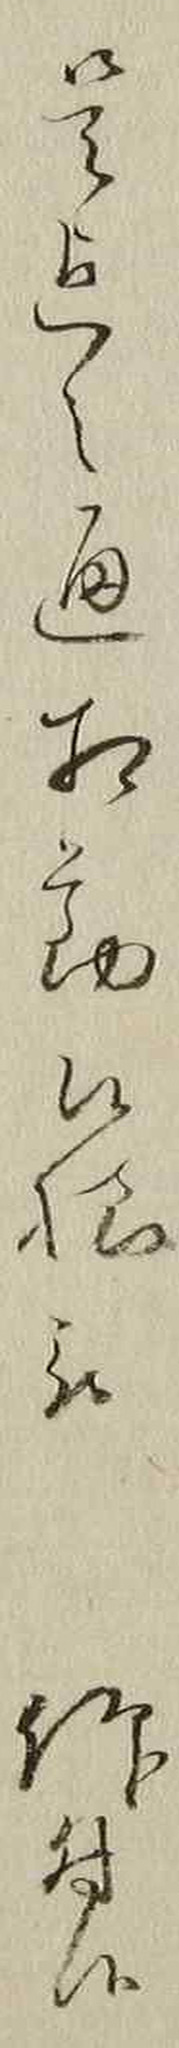是迄之通相勤候様被仰付候
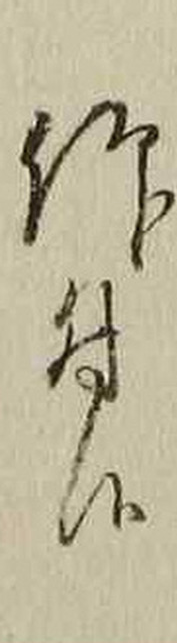仰出候
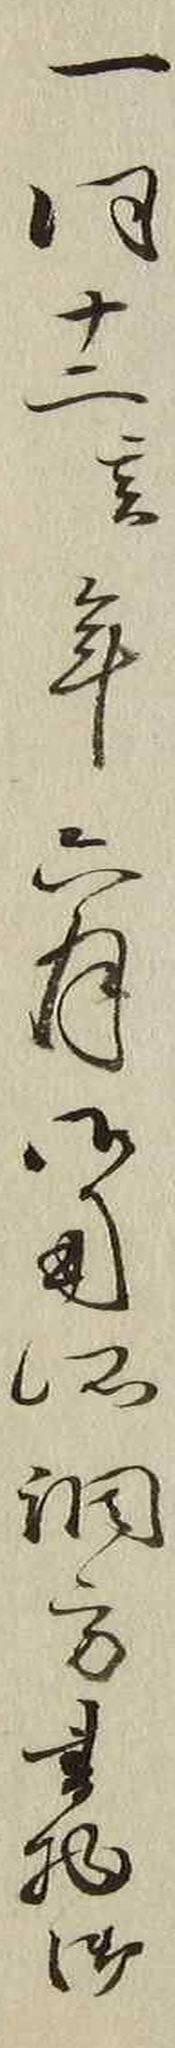一同十二亥年六月御用所調方書物御
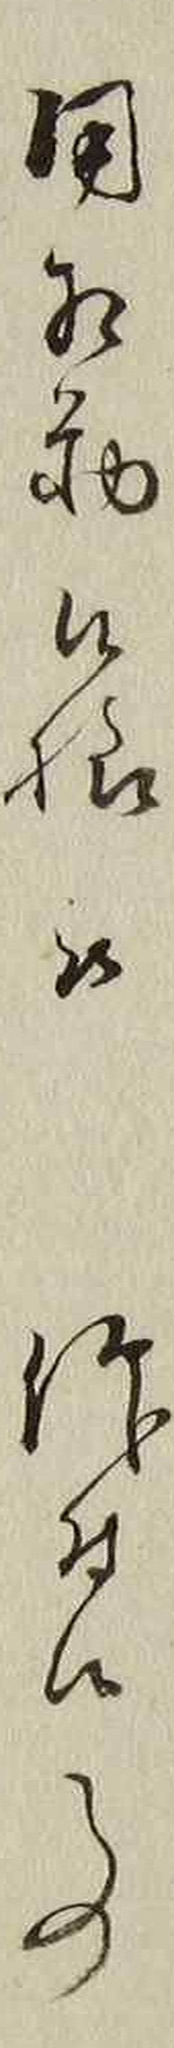用相勤候様被仰付候事
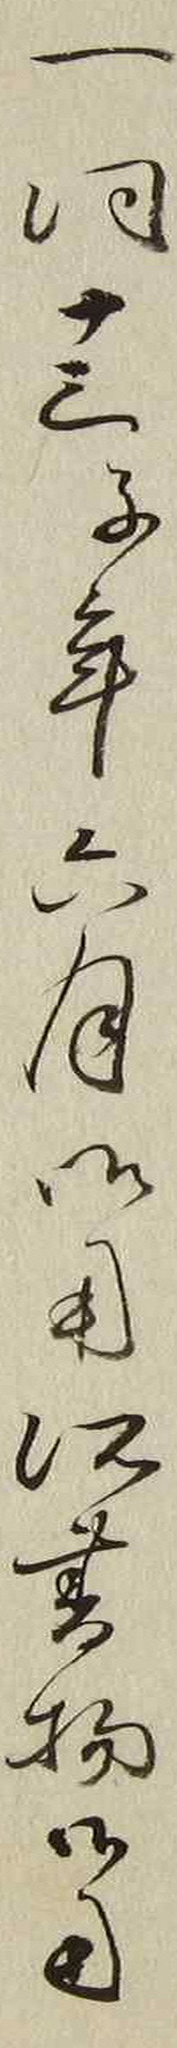一同十三子年六月御用所書物御用
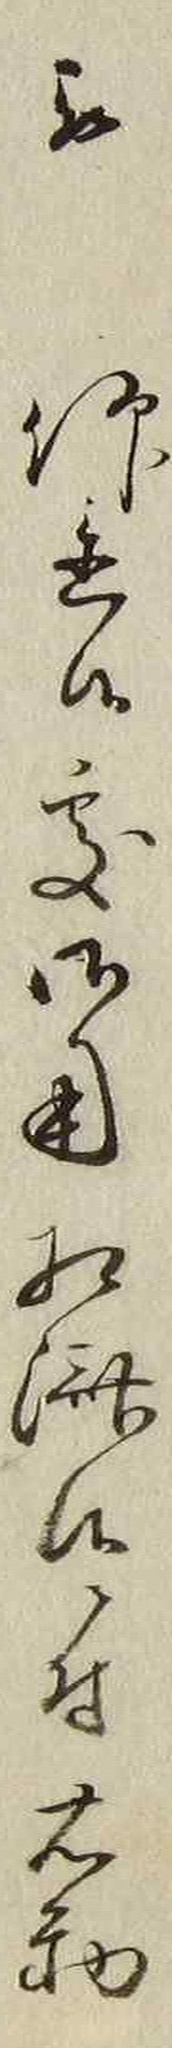被仰置候処御用相済候ニ付右勤
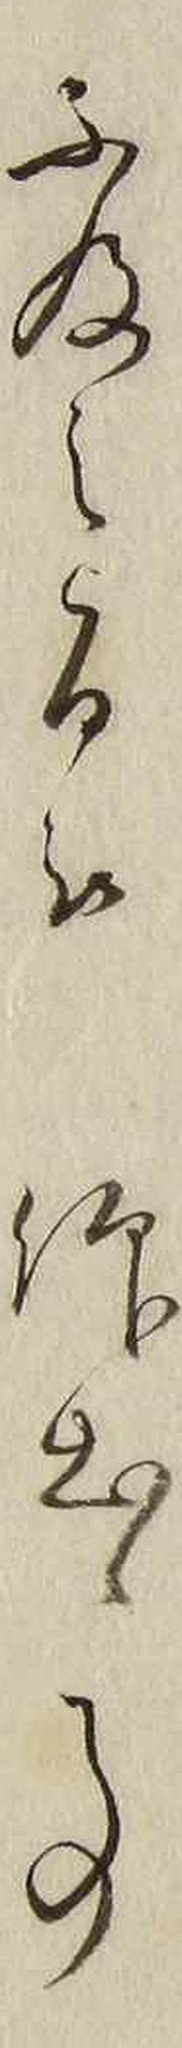不及之旨被仰出候事
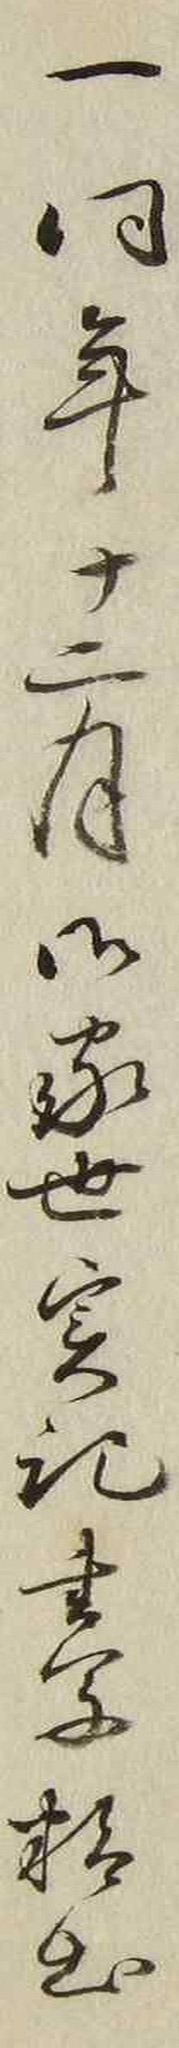一同年十二月御家世実記書写精出
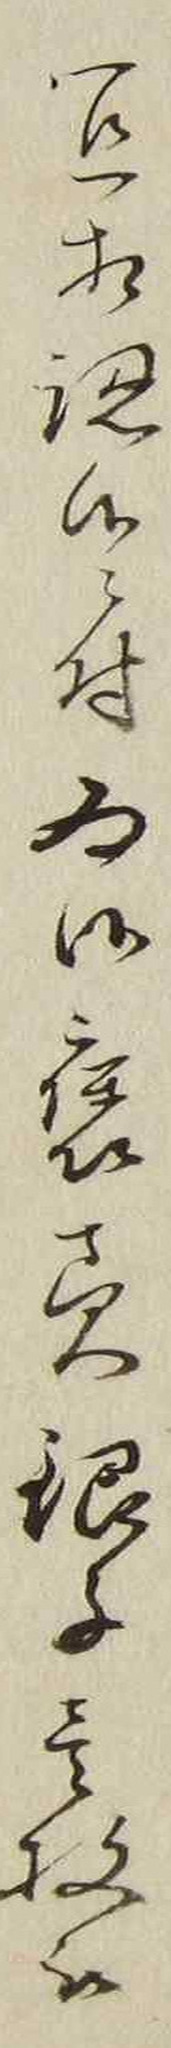宜相認候ニ付為御褒美銀子壱枚被

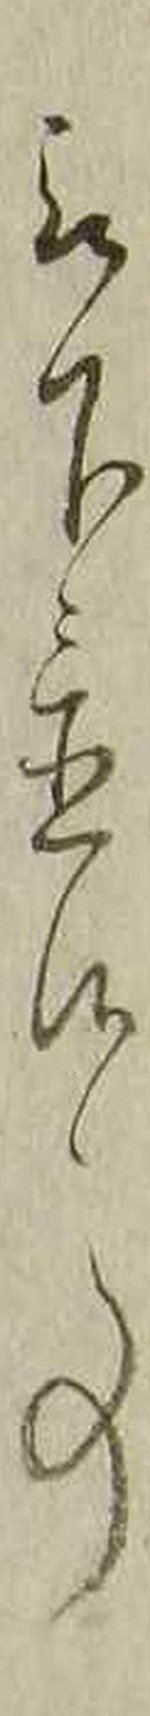被下置候事
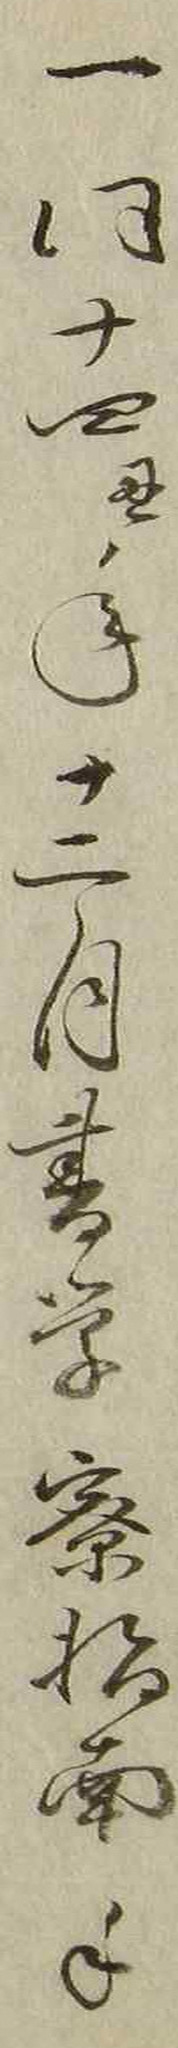一同十四丑年十二月書学寮指南手
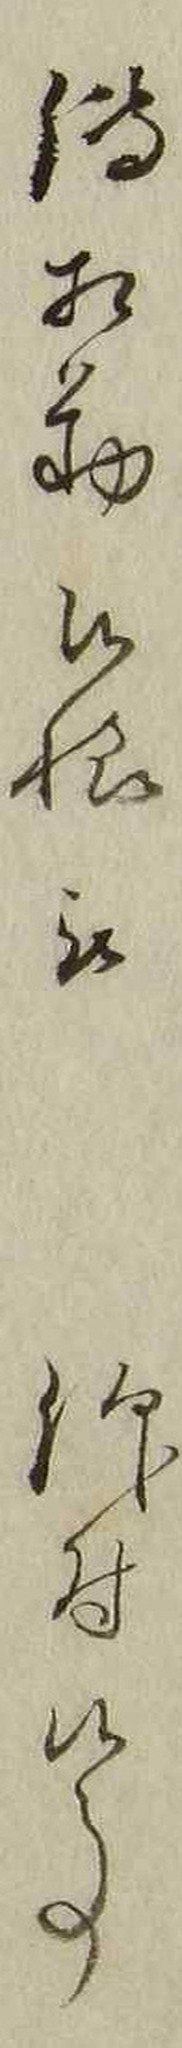伝相勤候様被仰付候事
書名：諸士系譜　巻之4　い之部4
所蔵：会津若松市立会津図書館
